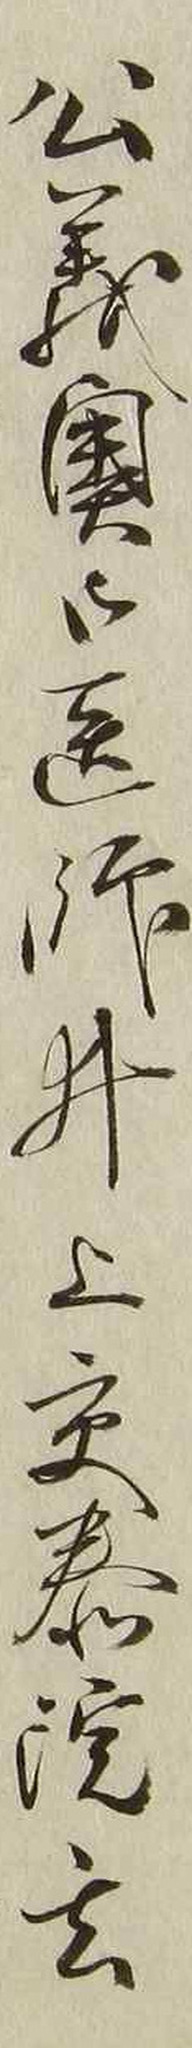公義奥御医師井上交泰院玄
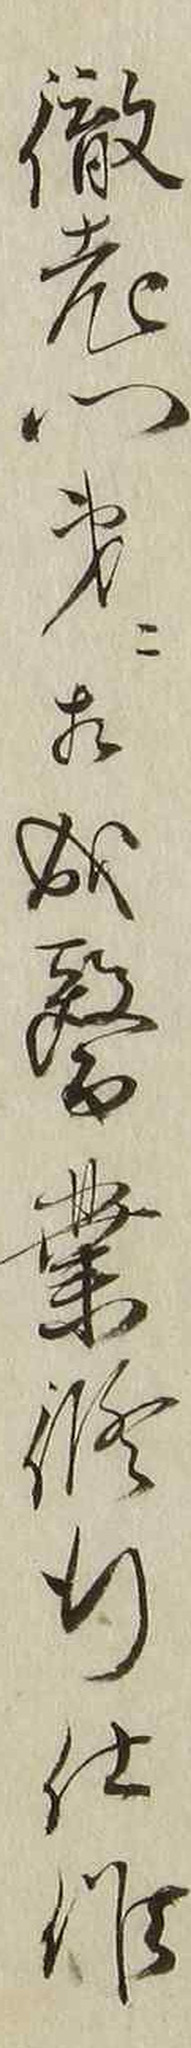徹老門弟に相成医業修行仕候
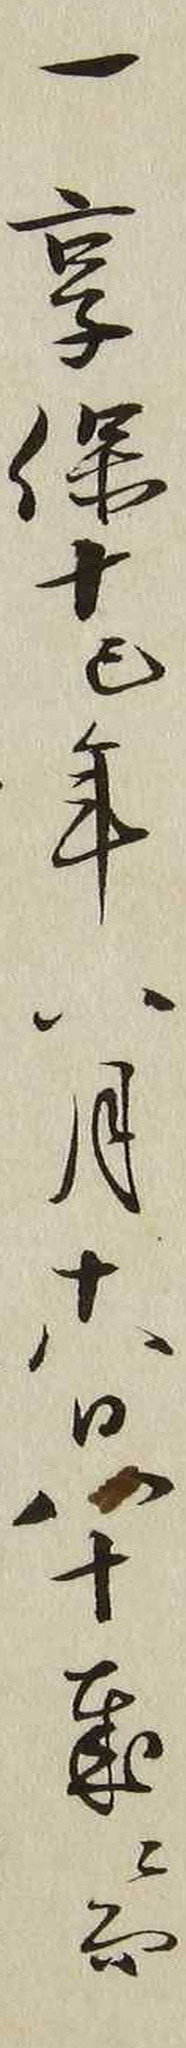一享保十巳年八月十八日八十歳に而
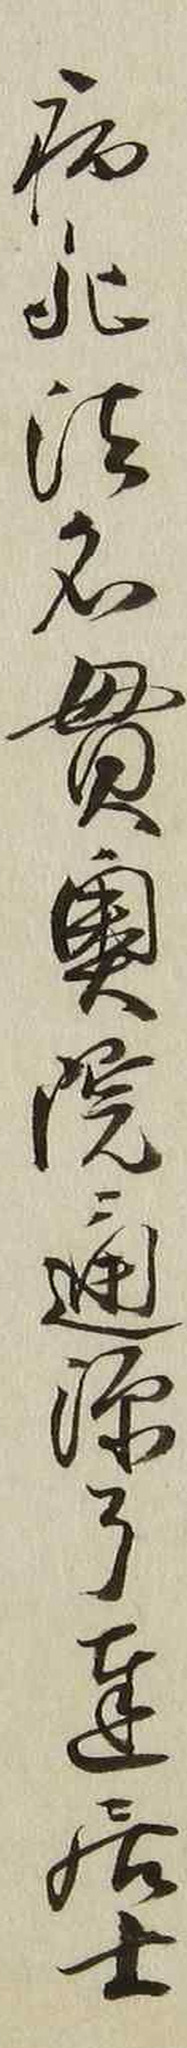病死法名貫奥院通源了達居士
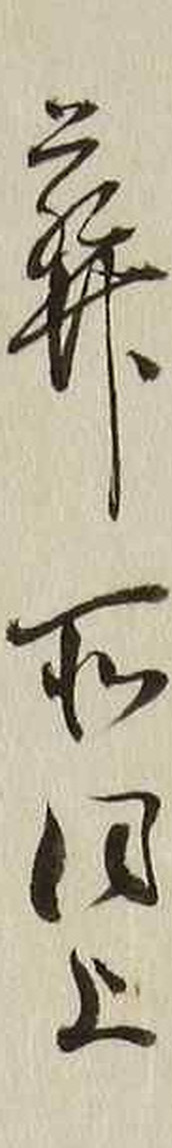葬所同上
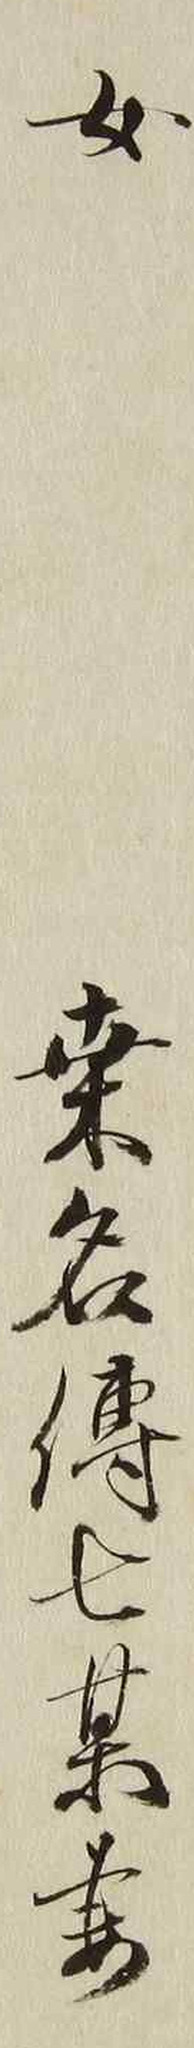女桑名伝七某妻
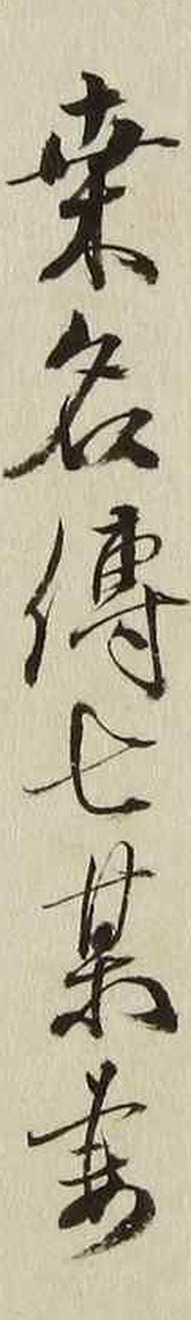女桑名伝七某妻
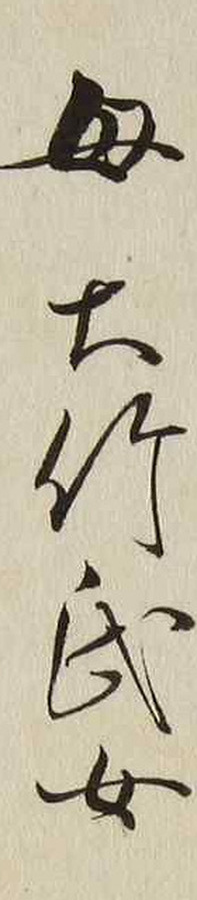母大竹氏女
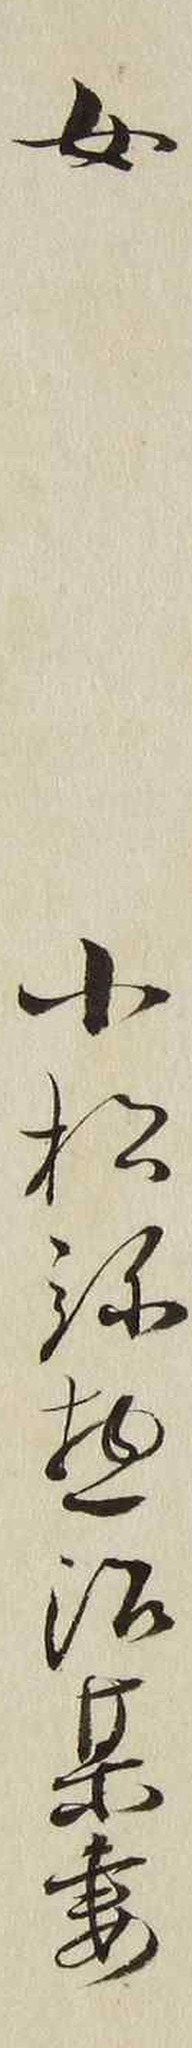女小松弥惣治某妻
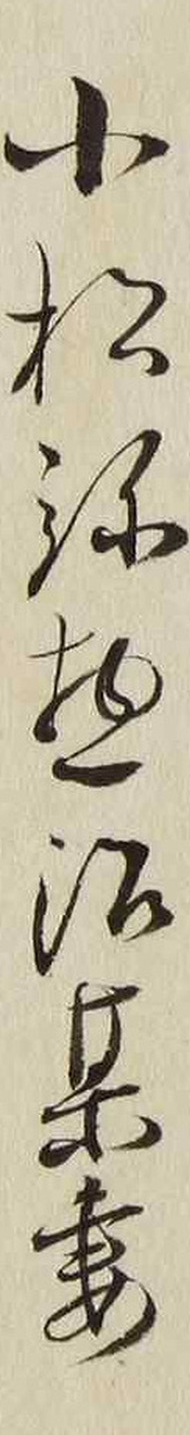女小松弥惣治某妻

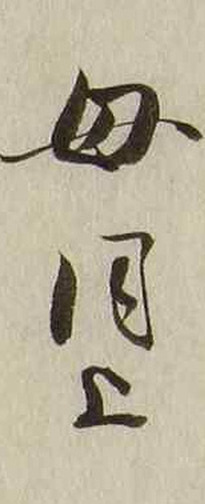母同上
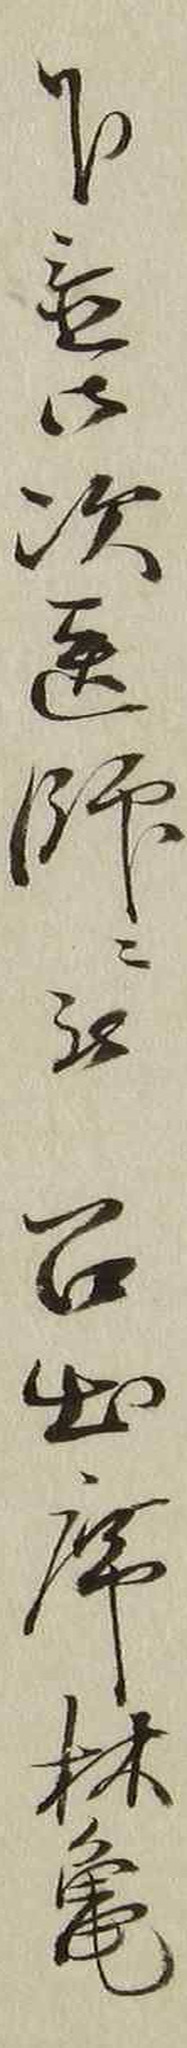下置御次医師に被召出席林亀
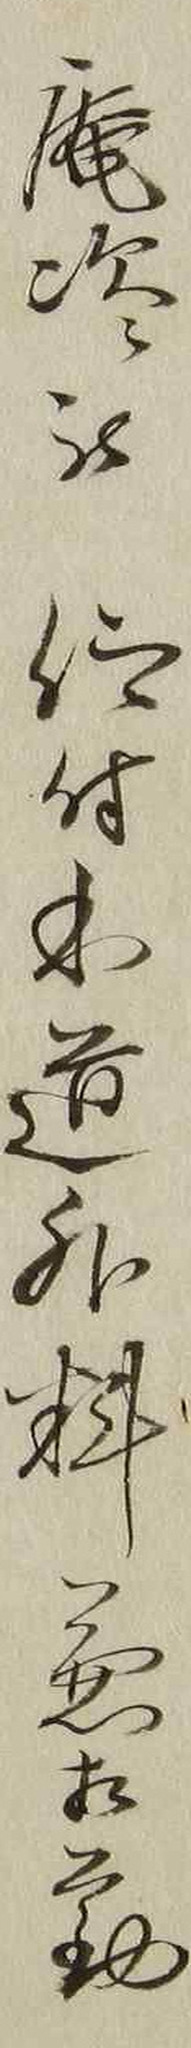庵次に被仰付本道外料兼相勤
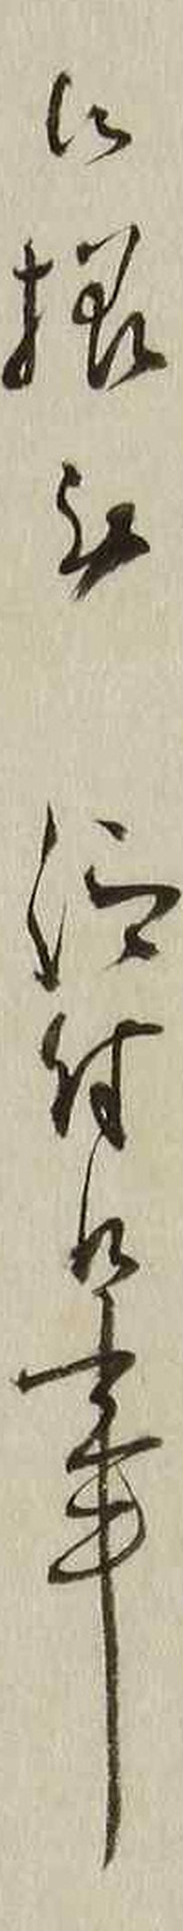候様被仰付候事
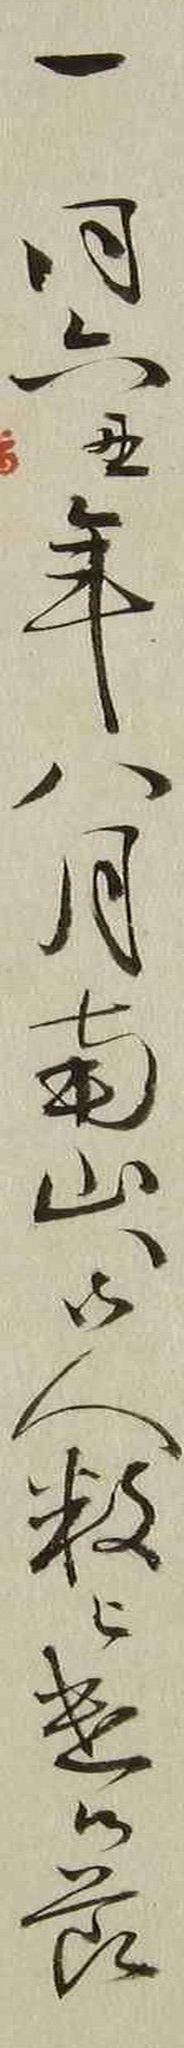一同六丑年八月南山へ御人数被遣候節
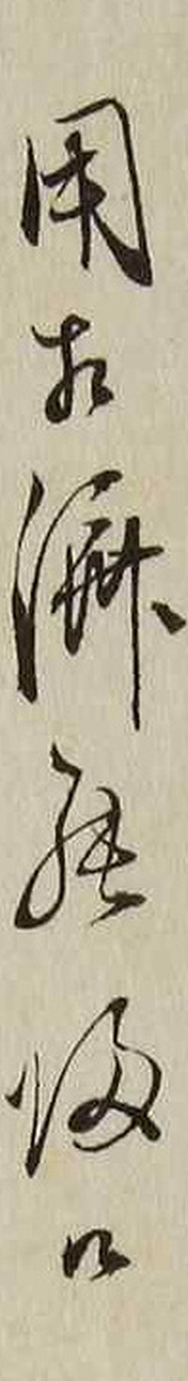用相済罷帰候
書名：諸士系譜　巻之157　ね之部1
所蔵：会津若松市立会津図書館
